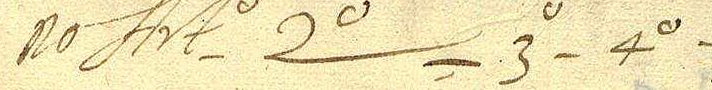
No Arto 2o - 3o - 4o
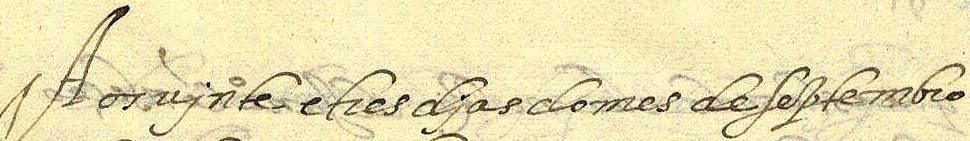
Aos ujnte e tres dias do mes de septembro
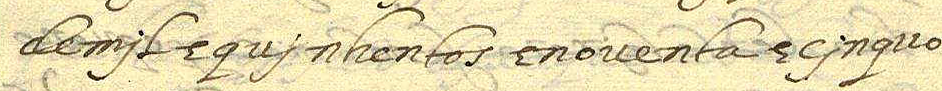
de mjl E qujnhentos E nouenta E cjnquo
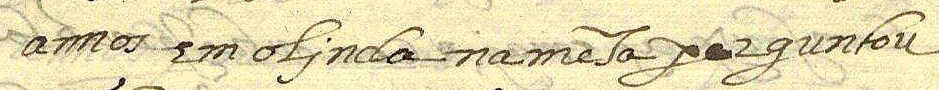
annos Em Oljnda na meza perguntou
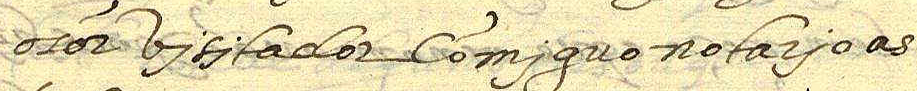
o sōr Vjsitador Cōmjguo notarjo as
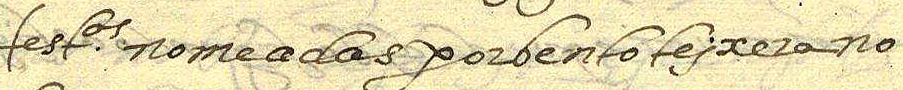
test.as nomeadas por bento tejxera
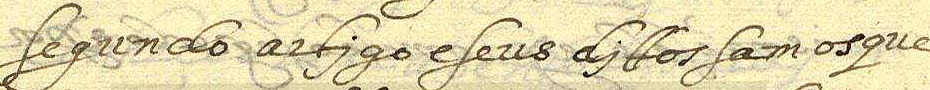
no segundo artjgo e seus djttos sam os que
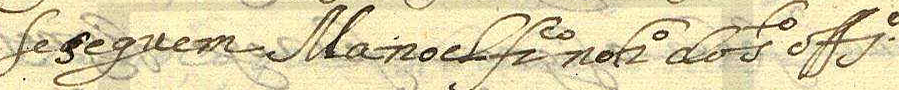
se seguem Manoel frco notro do sto offjo
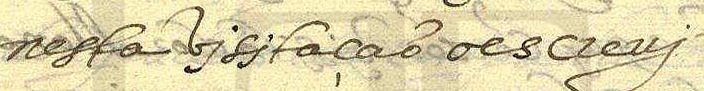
nesta vjsjtaçaõ o escreuj
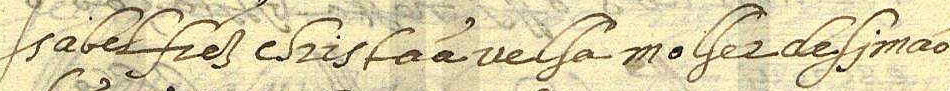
Jsabel frez̄ christaā uelha molher de Sjmaõ
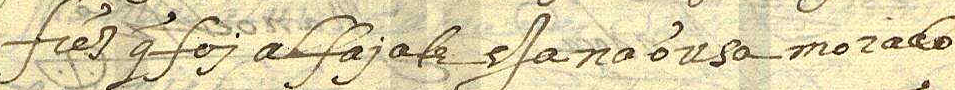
frēz q̄ foj alfajate E Ja naõ usa morado
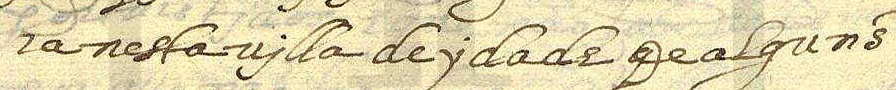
ra nesta ujlla de ydade De alguns̄
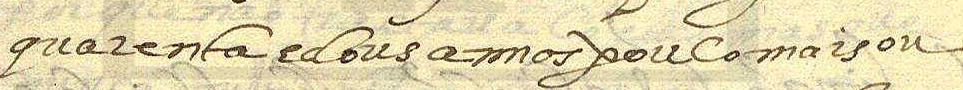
quarenta E dous annos pouco mais ou
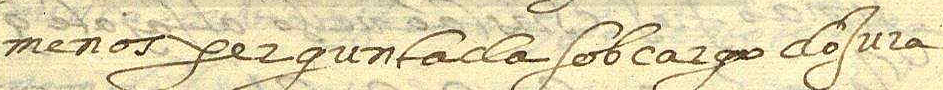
menos perguntada sob cargo do Jura
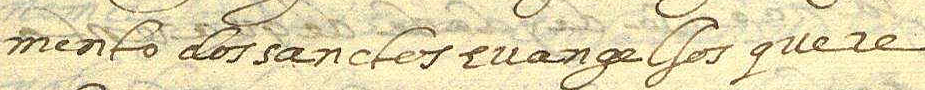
mento dos sanctos Euangelhos que re
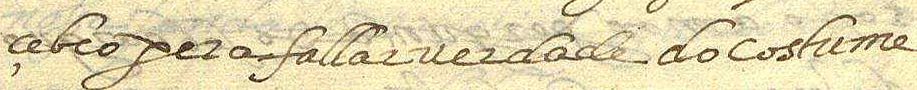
çebeo pera falar uerdade do costume
